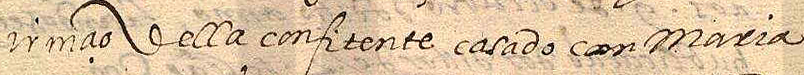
irmão della confitente casado com Maria
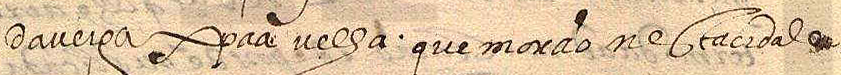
da ueiga Xpāa uelha. que morão nesta cidade
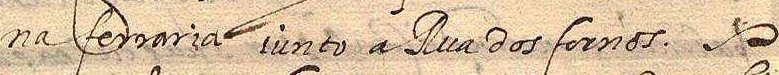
na ferraria iunto a Rua dos fornos. e
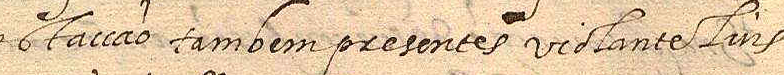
estauaõ tambem presentes violante luis
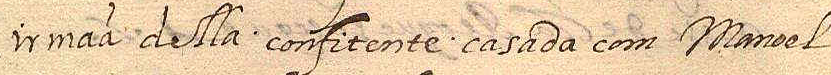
irmaā della. confitente. casada com Manoel
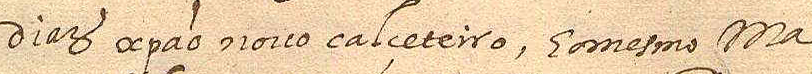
diaz xpão nouo calçeteiro, E o mesmo Ma
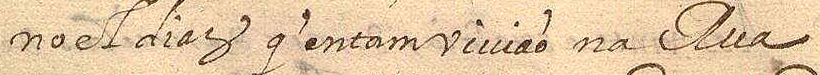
noel diaz q̄ entam viuiaõ na Rua
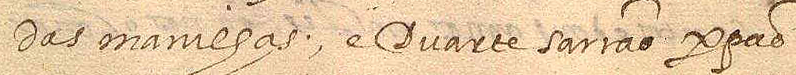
das manilhas, e Duarte sarrão xpaõ
